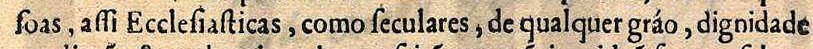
soas, assi Ecclesiasticas, como seculares, de qualquer gráo, dignidade
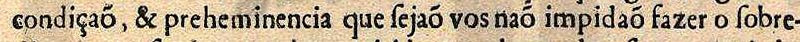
condiçaõ, & preheminencia que sejaõ vos naõ impidaõ fazer o sobre
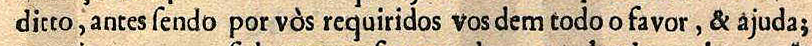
ditto, antes sendo por vòs requiridos vos dem todo o favor, & ajuda;
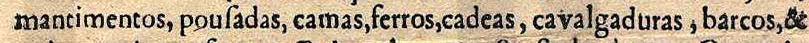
mantimentos, pousadas, camas, ferros, cadeas, cavalgaduras, barcos, &
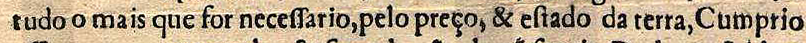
tudo o mais que for necessario, pelo preço, & estado da terra, Cumprio
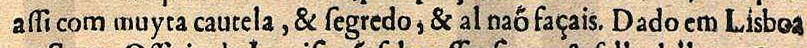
assi com muyta cautela, & segredo, & al naõ façais. Dado em Lisboa
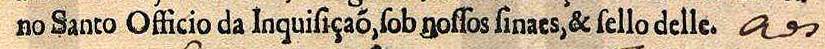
no Santo Officio da Inquisiçaõ, sob nossos sinaes, & sello delle. aos
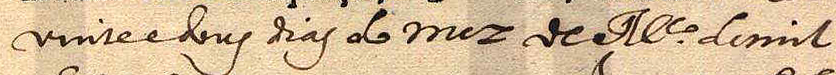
vinte e dous dias do mez de M.ço de mil
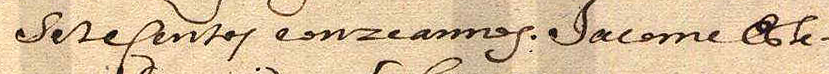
seteCentos e onze annos. Iacome Este
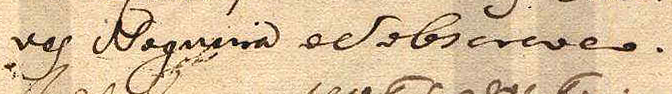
ves Nogueira o Sobscreveo.
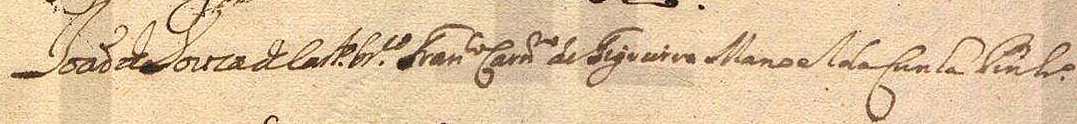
Ioaõ de Souza de Cast.obr.co Franco Carnro de Figueiroa Manoel da Cunha Pinh.o
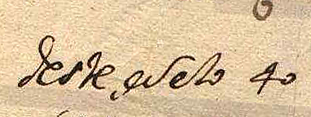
deste e selo 40
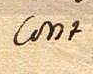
cont
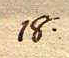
18.
